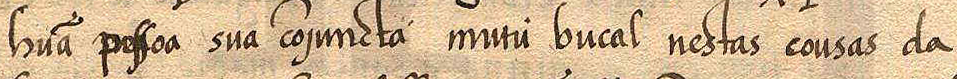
hu̅a pessoa sua c̅ojuncta mutu bucal nestas cousas da
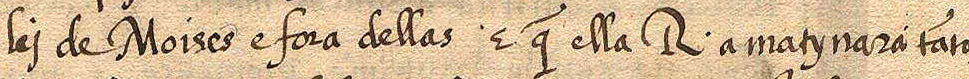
lej de Moises e fora dellas E q̅ ella R. a matynara ta̅to
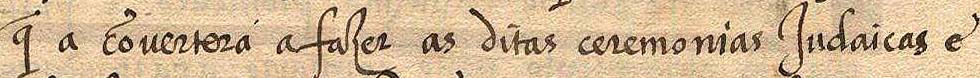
q̅ a c̅ouertera a faZer as ditas ceremonias Judaicas e
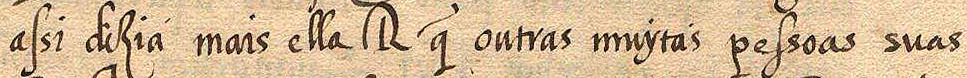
assi diZia mais ella R q̅ outras muytas pessoas suas
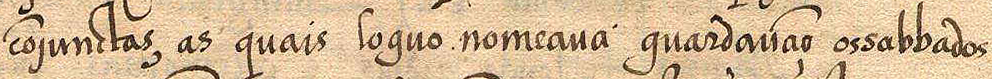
c̅ojunctas, as quais loguo nomeaua guardauão os sabbados
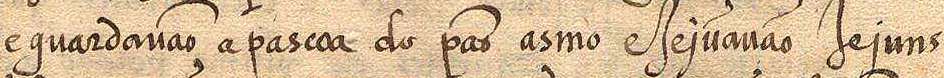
e guardauão a pascoa do pão asmo e Jeju̅auão Jejuns
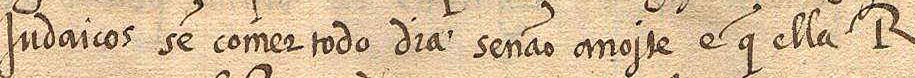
Judaicos se̅ comer todo dia senão a nojte e q̅ ella R.
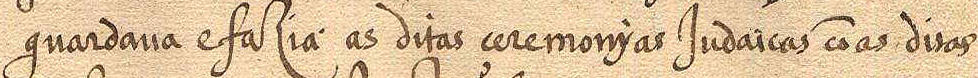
guardaua e faZia as ditas çeremonyas Judaicas c̅o as ditas
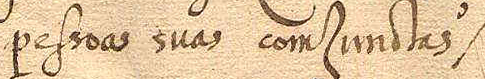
pessoas suas comjunctas /
